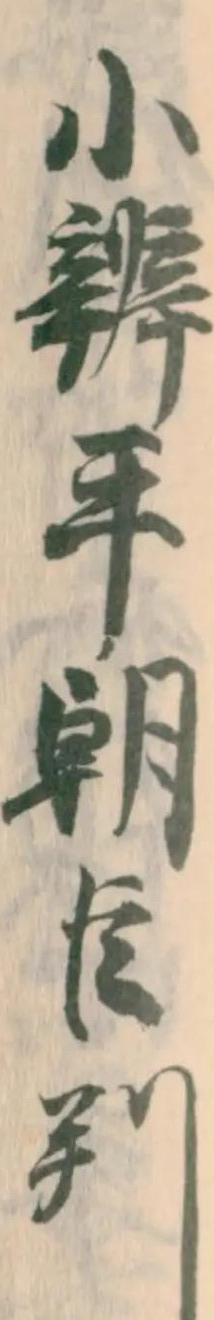小辨平朝臣判
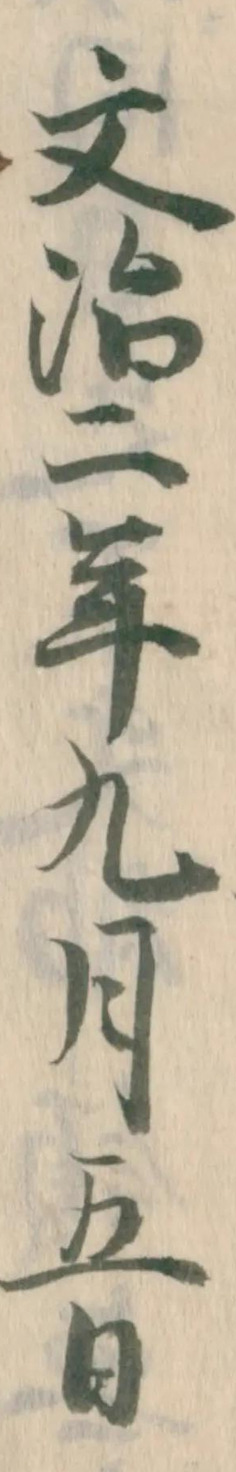文治二年九月五日

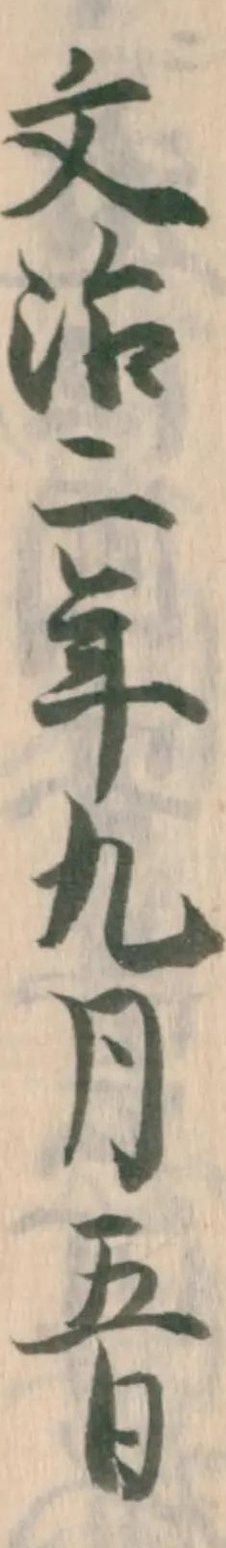文治二年九月五日
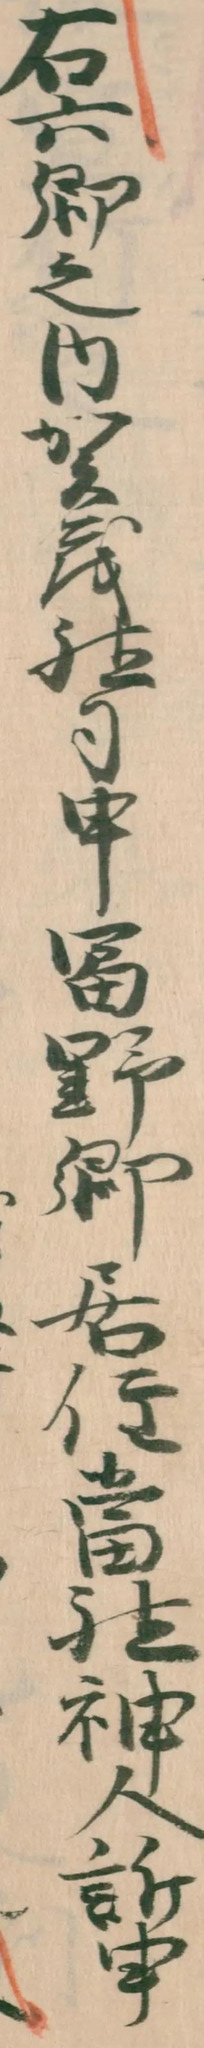右六郷之内賀茂社司申富野郷居住当社神人訴申
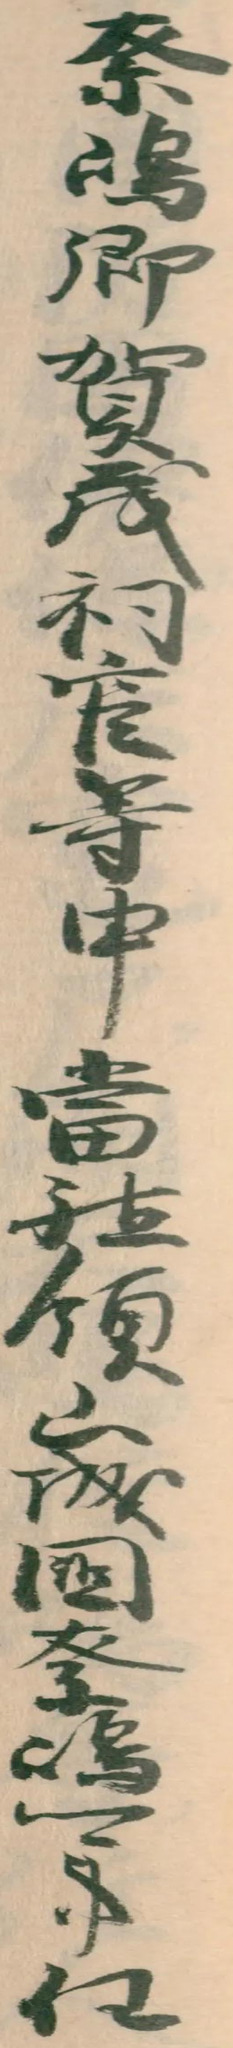奈嶋郷賀茂祠官等申当社領山城国奈嶋郷事任
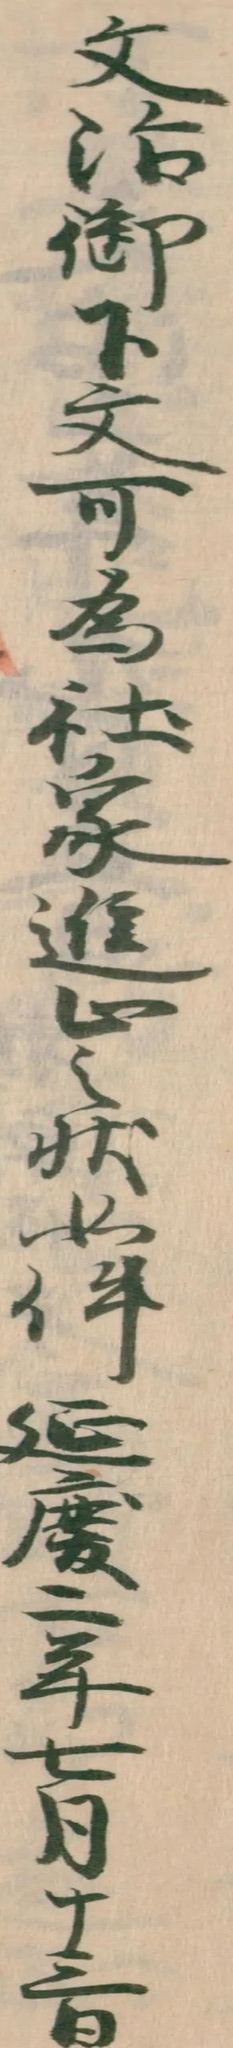文治御下文可為社家進止之状如件延慶二年七月十三日
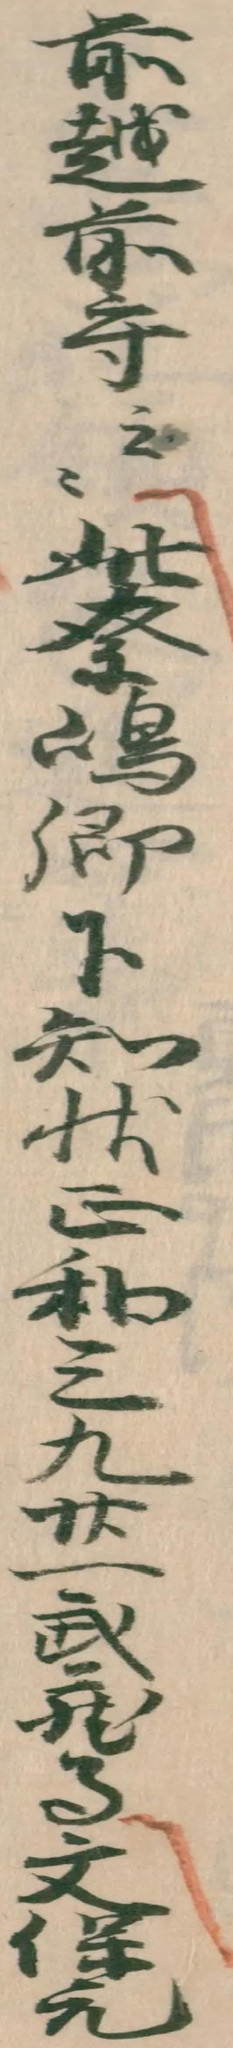前越前守云々此奈嶋郷下知状正和三九廿一武蔵守文保元
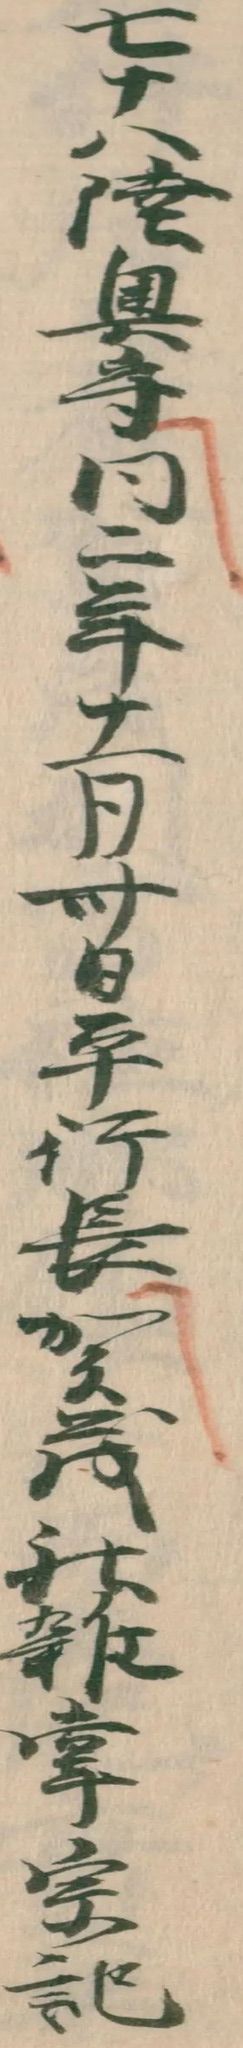七十八陸奥守同二年十一月卅日平行長賀茂社雑掌宗記
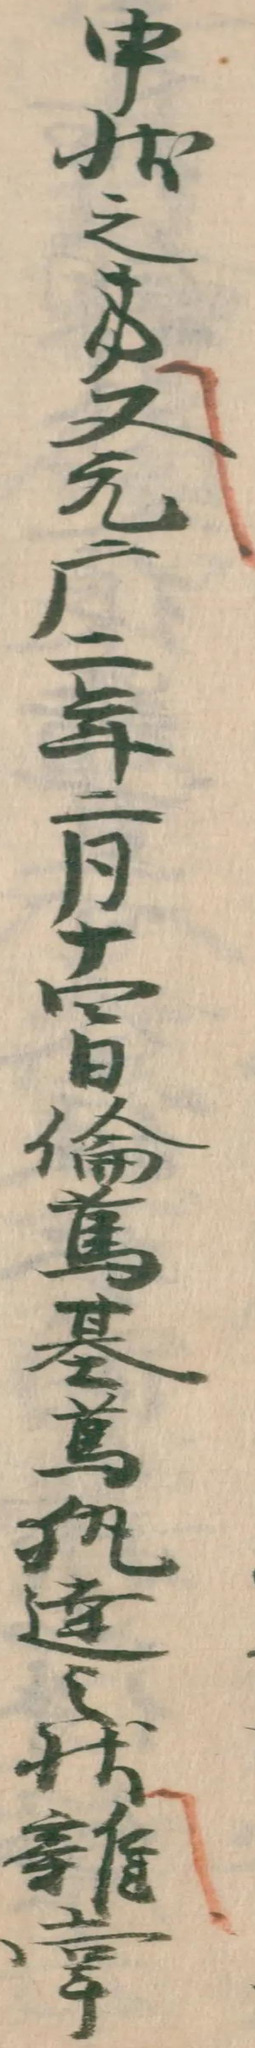申状之事又元応二年二月十四日倫篤基篤執達之状雑掌
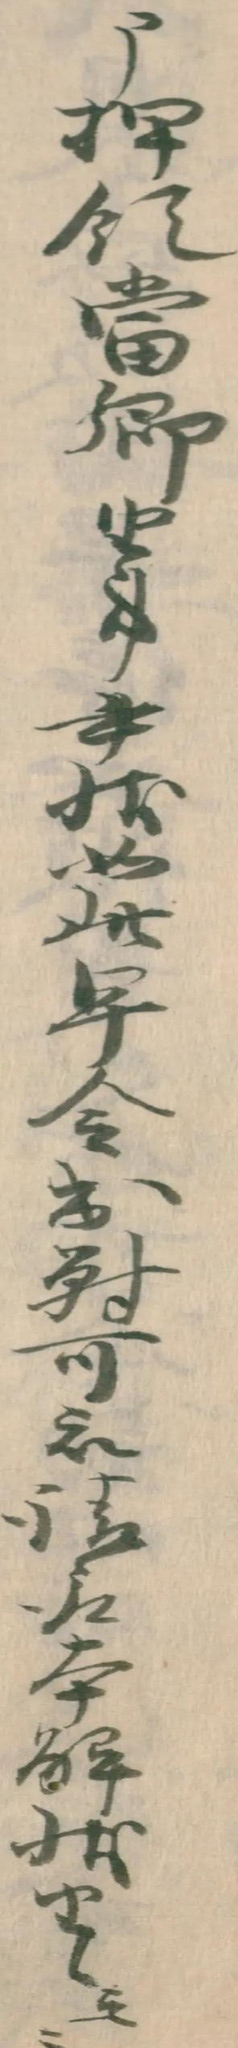申押領当郷由事書状如此早令出対可被請取本解状由候云々

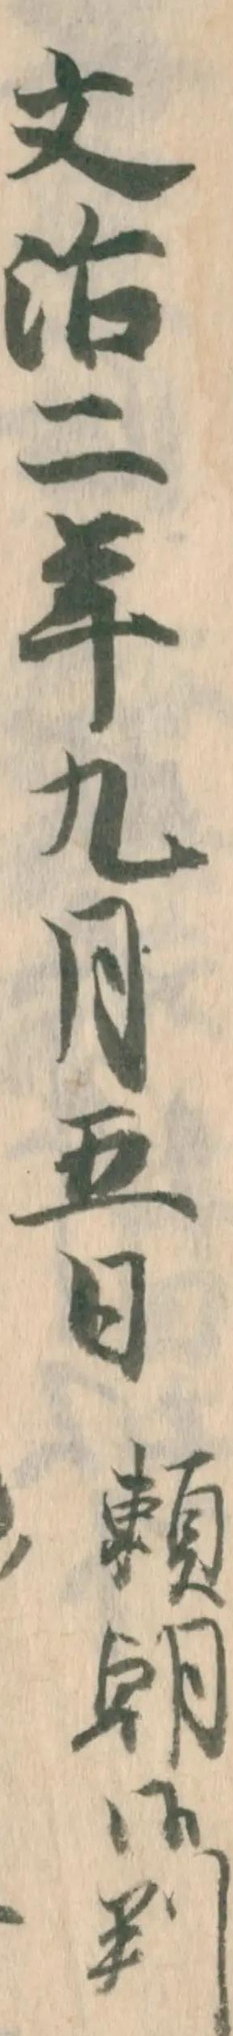文治二年九月五日頼朝御判
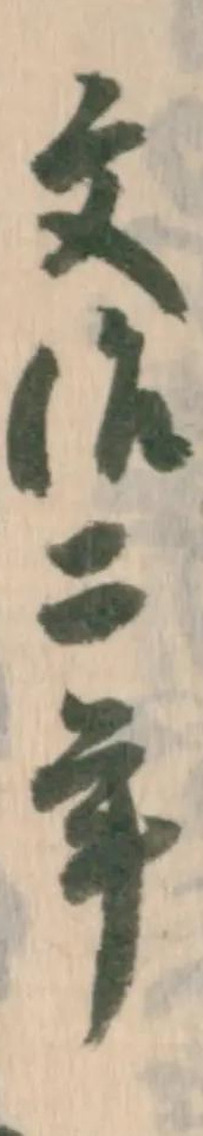文治二年
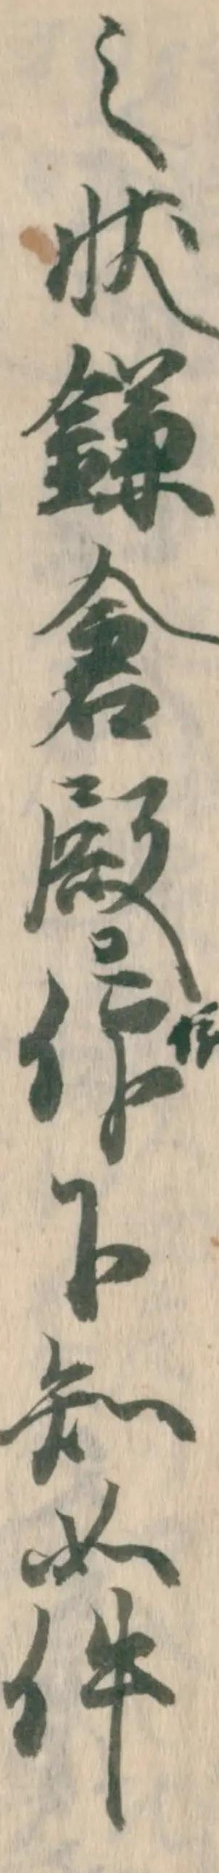之状鎌倉殿◦仰下知如件
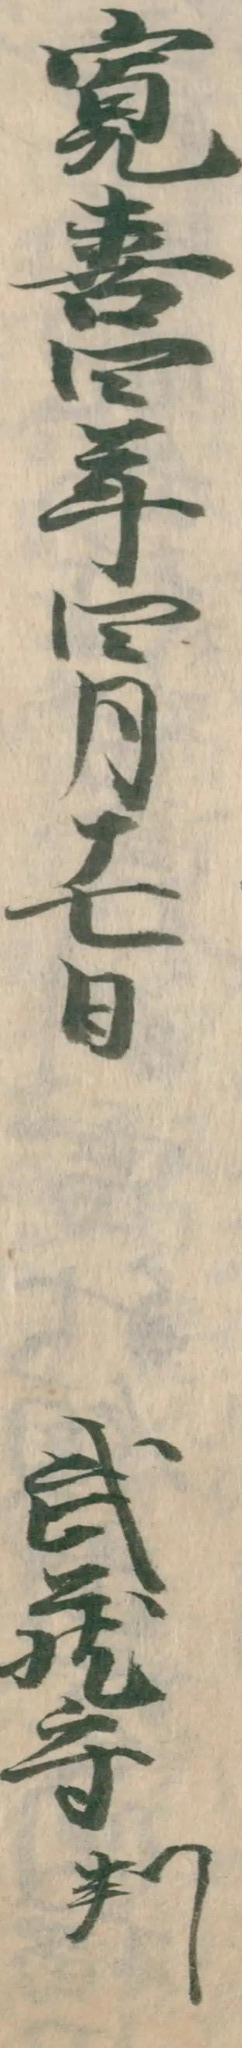寛喜四年四月十七日武蔵守判
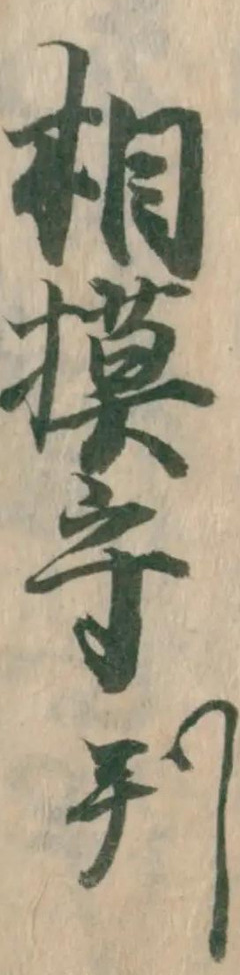相模守干

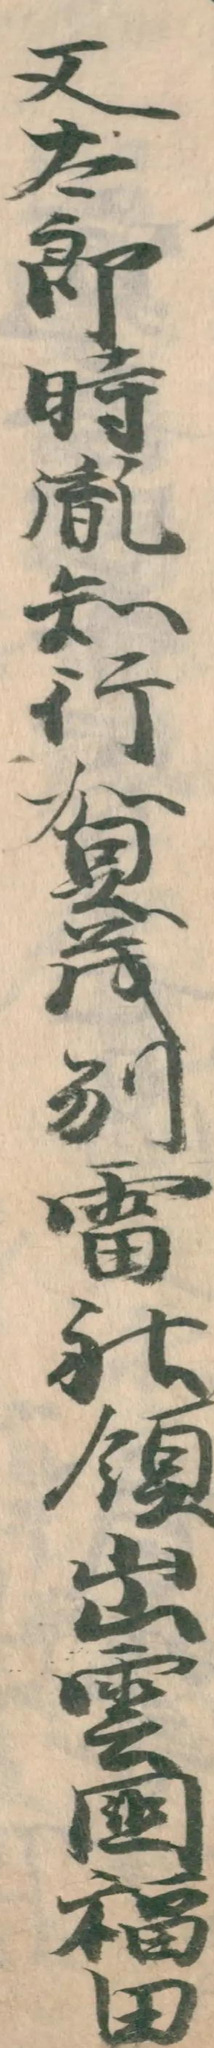又太郎時胤知行賀茂別雷社領出雲国福田
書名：賀茂社記録. 第1冊
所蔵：国立国会図書館 National Diet Library, JAPAN
